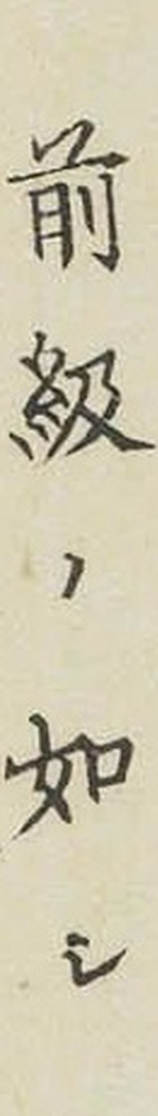前級ノ如シ
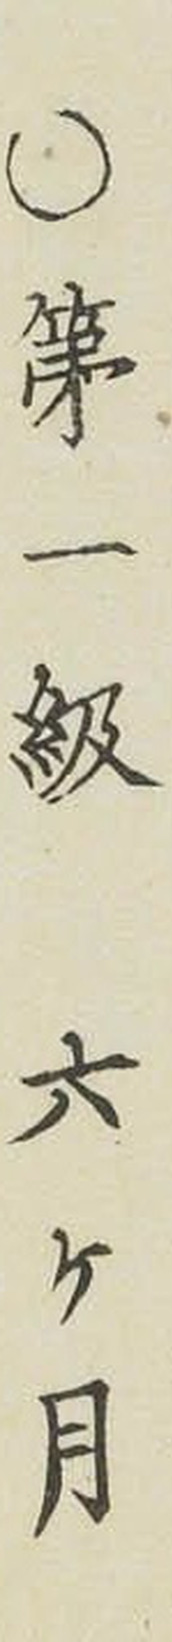○第一級六ケ月
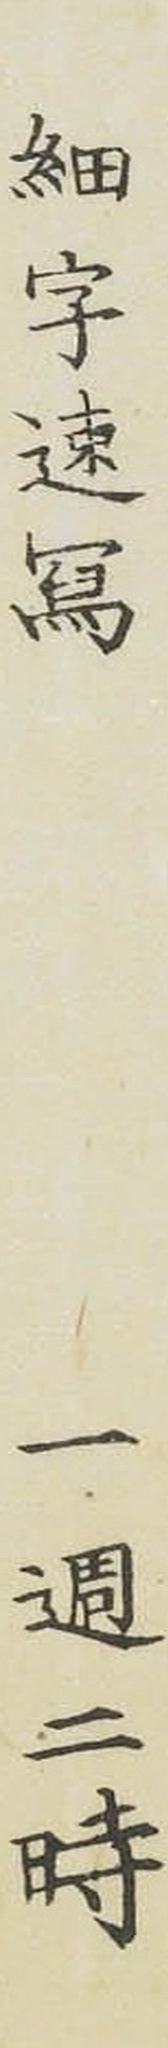細字速写一週二時
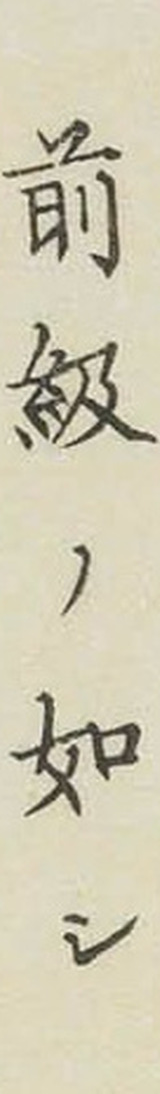前級ノ如シ
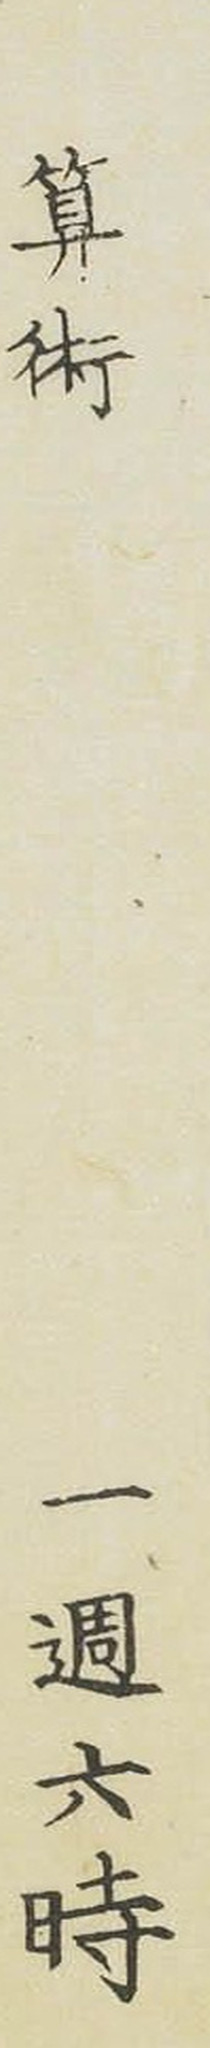算術一週六時
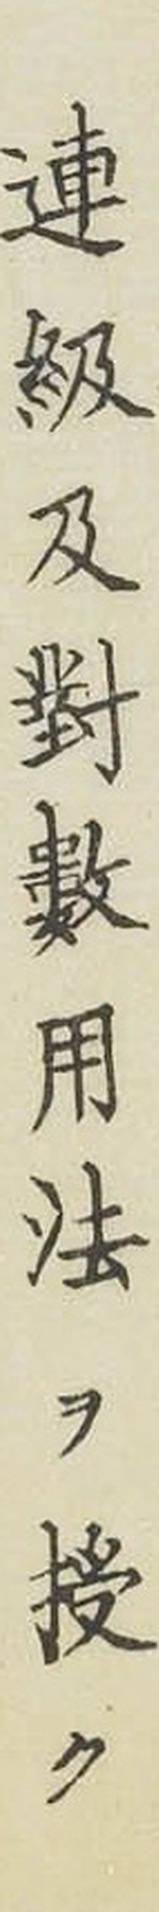連級及対数用法ヲ授ク
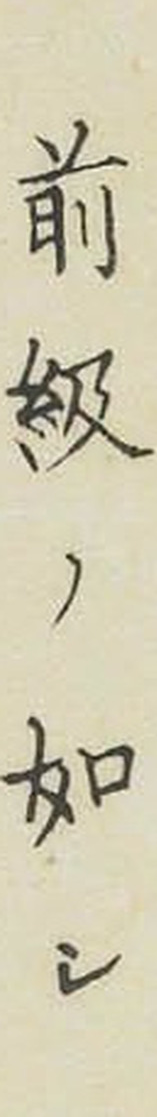前級ノ如シ
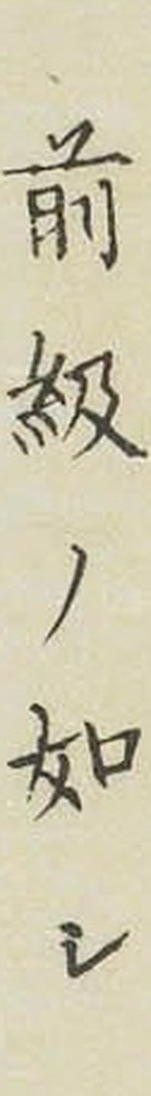前級ノ如シ
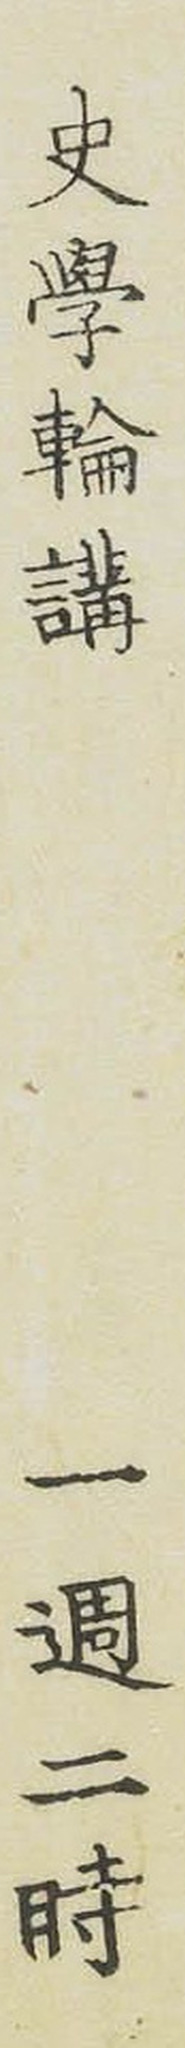史学輪講一週二時
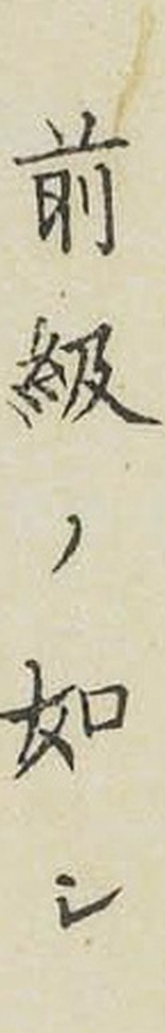前級ノ如シ
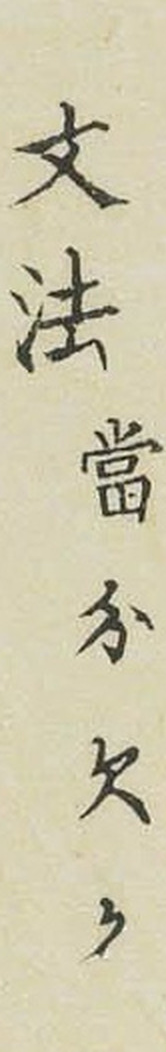文法当分欠ク
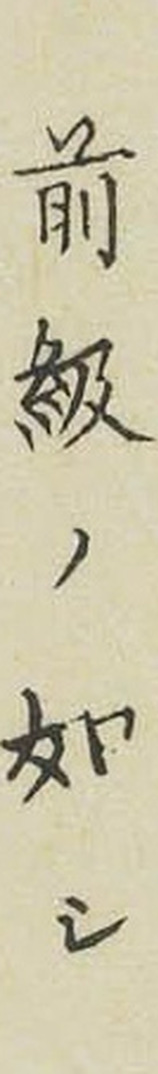前級ノ如シ

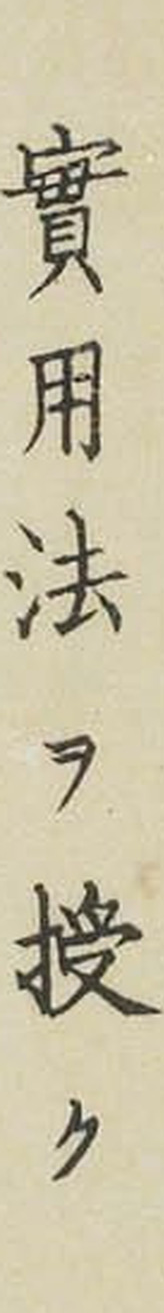実用法ヲ授ク
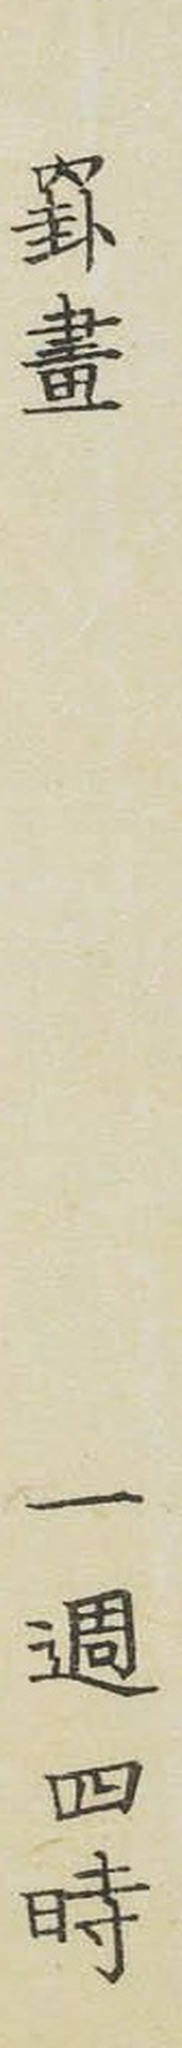罫書一週四時
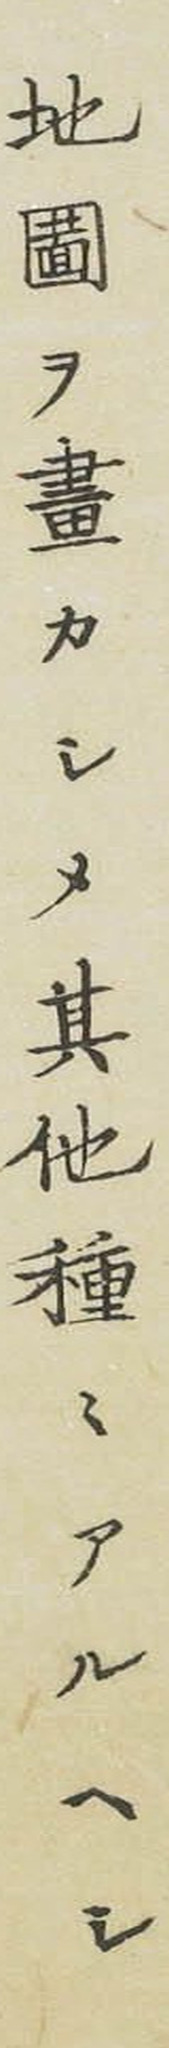地図ヲ書カシメ其他種々アルヘシ
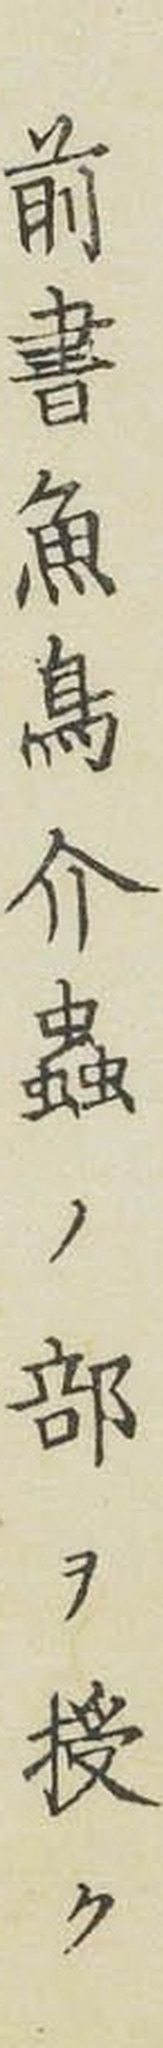前書魚鳥介蟲ノ部ヲ授ク
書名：小学教則
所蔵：東京学芸大学教育コンテンツアーカイブ
